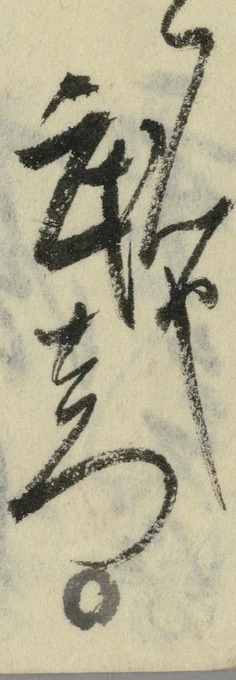武右衛門
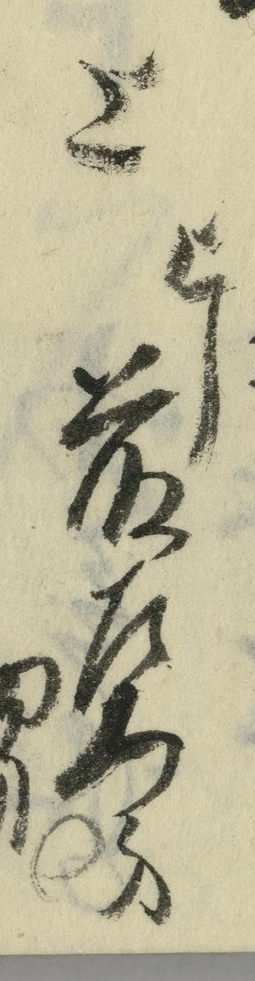上藤左衛門方

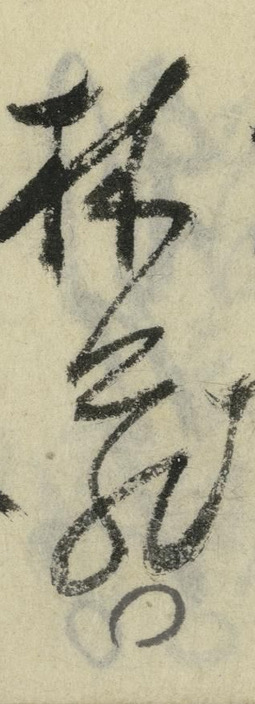小兵衛
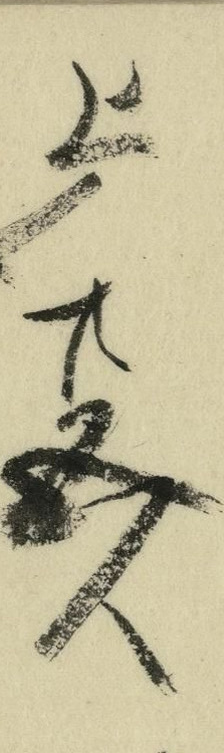上〆廿五人
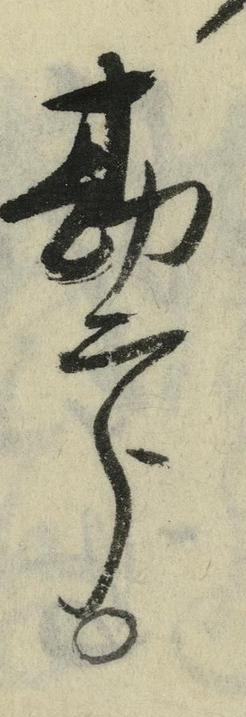勘二郎
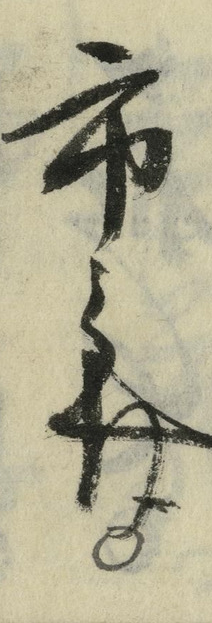市兵衛
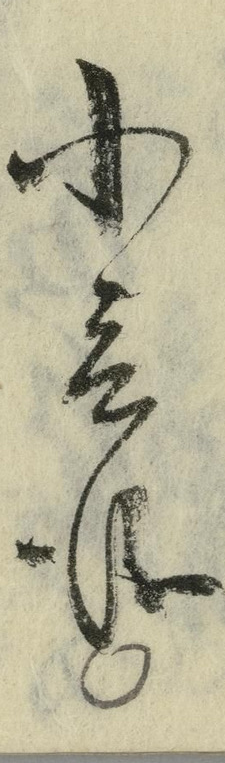小兵衛
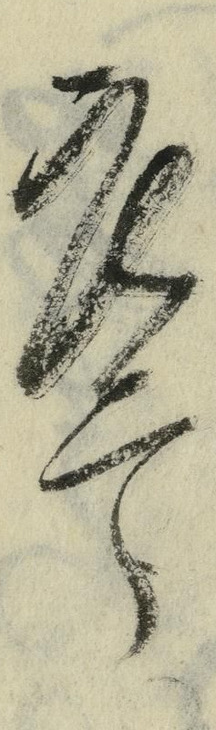勘二郎
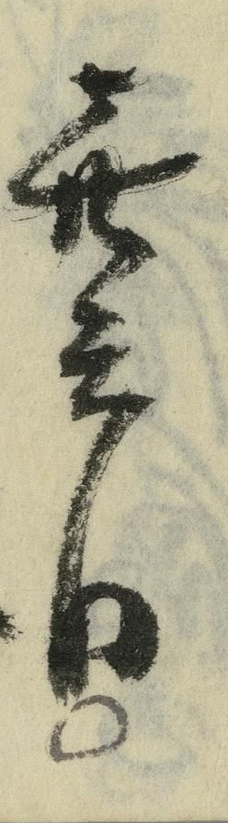喜兵衛
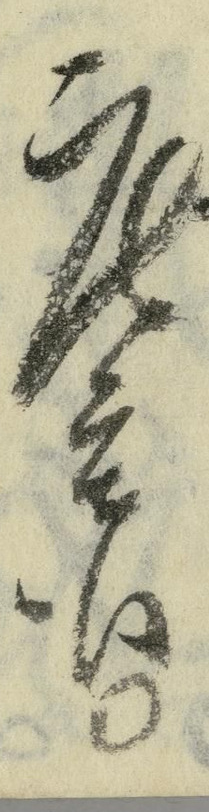小兵衛
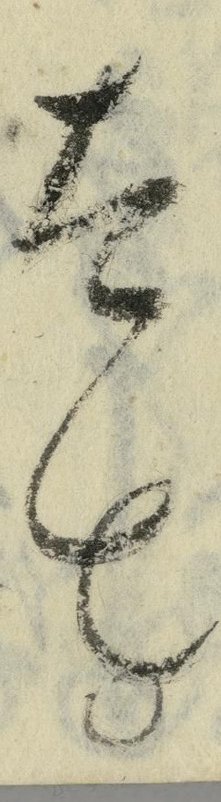小兵衛

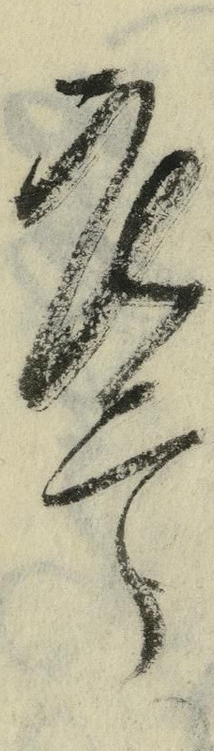金二郎
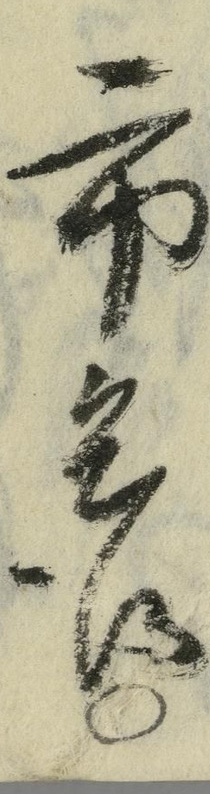兵郎兵衛
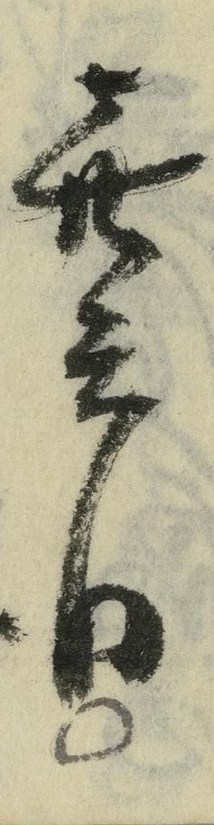庄兵衛
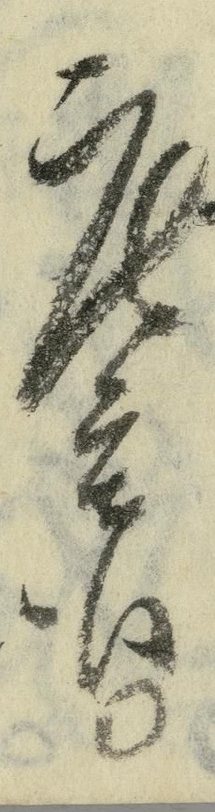庄兵衛
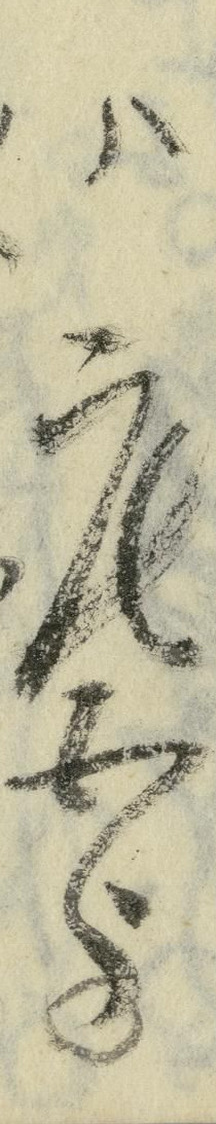ハ庄五郎
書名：天明淺間噴火ニ関スル書類
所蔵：東京大学地震研究所図書室 Earthquake Research Institute Library, The University of Tokyo, JAPAN
